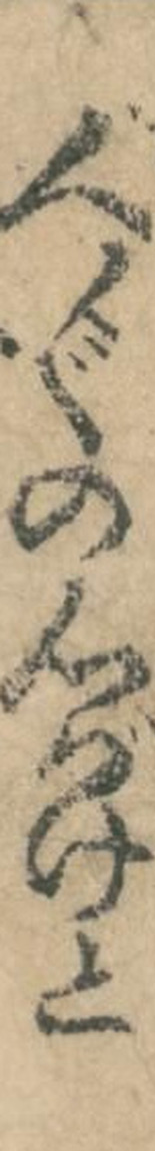人〴〵の心がけと
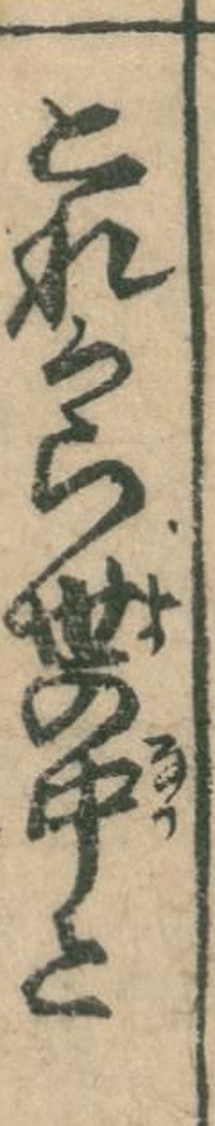これから世の中と
